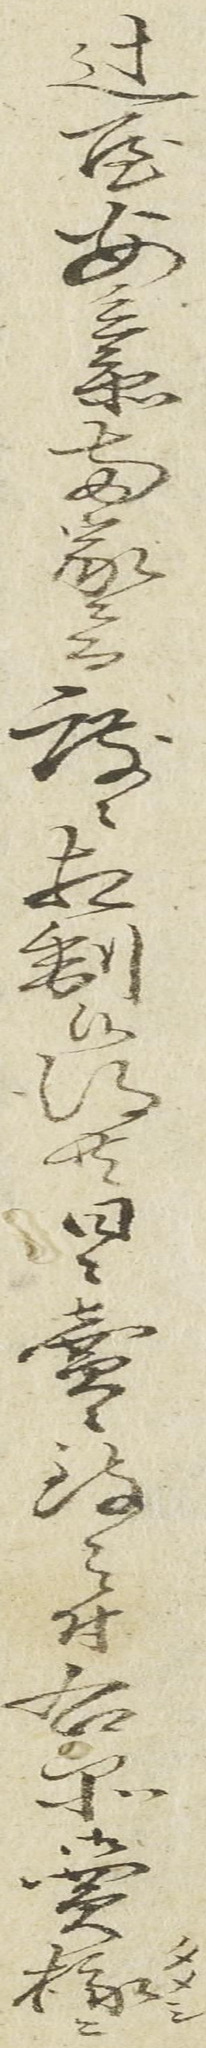辻屋安兵衛両家ニ而度々相制候得共日々売ニ致候ニ付右品御買様ニ
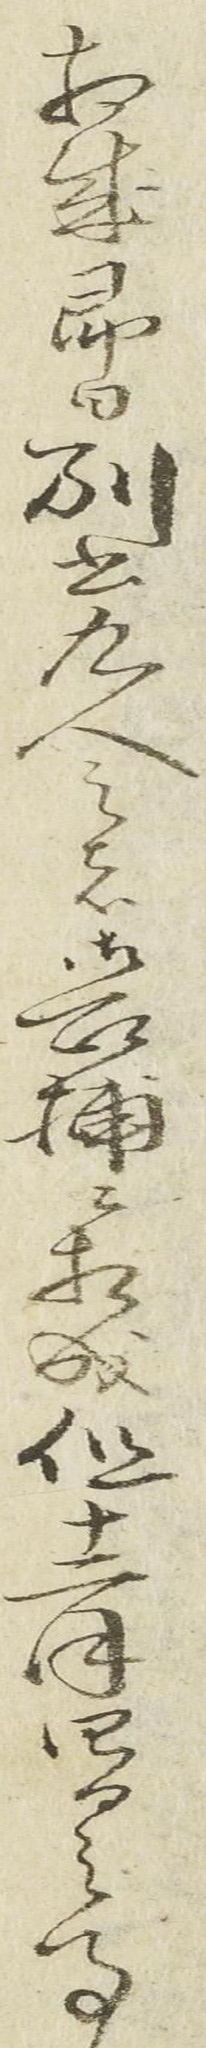相成即日別書九人之者御召捕ニ相成但十二月四日之事
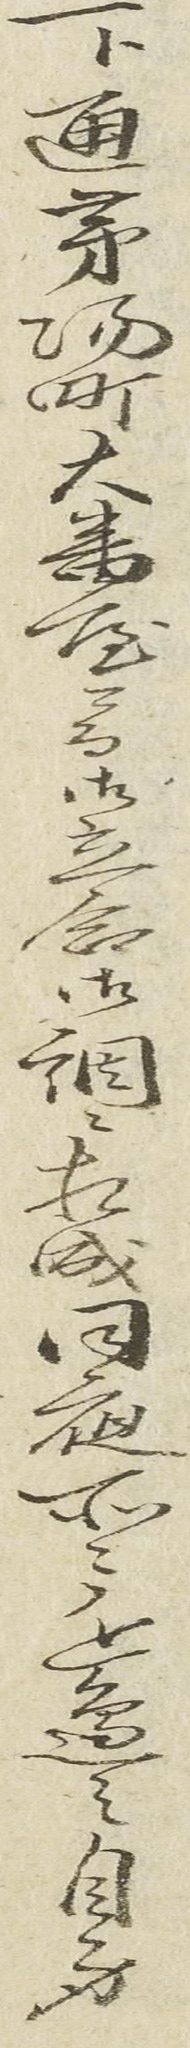下通茅場町大番屋ニ而御立合御調に相成同夜所々近辺之自身
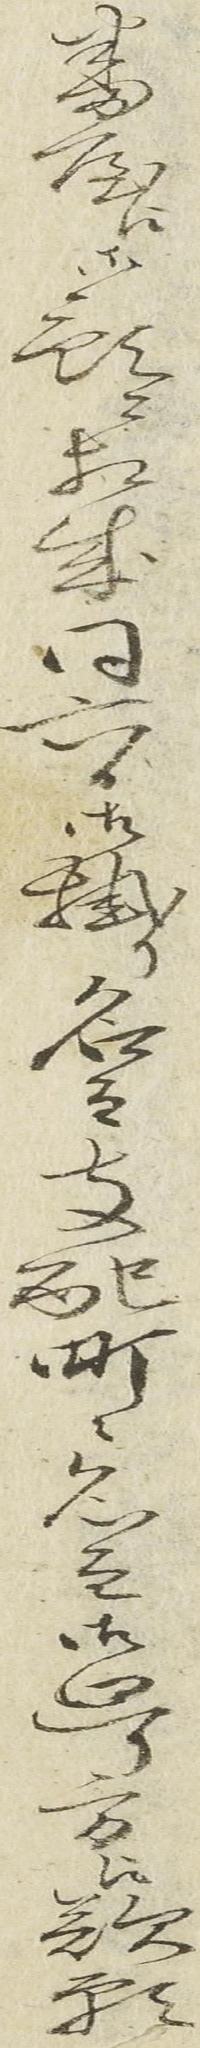番屋江御預に相成同六日御掛り名主支配町々名主御廻り方江歎願
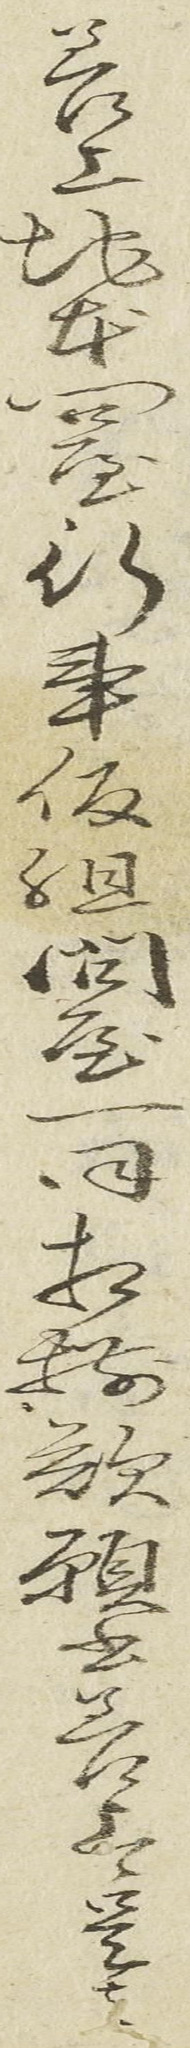差上地本問屋行事仮組問屋一同相揃歎願書差上候是は
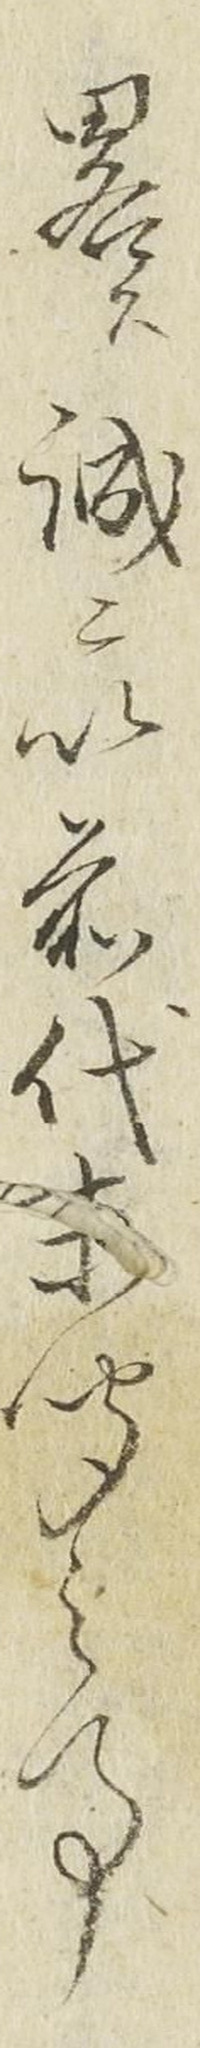略ス誠二以前代未聞の事
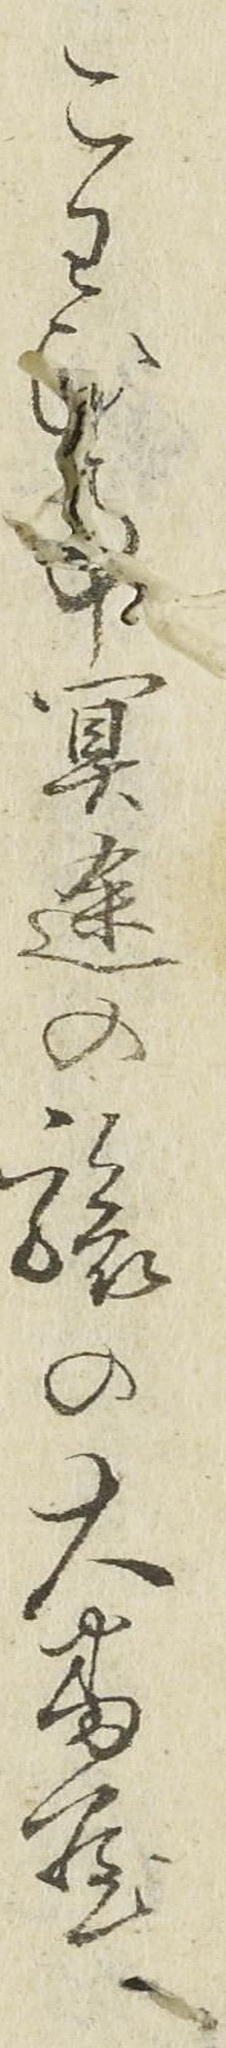こわひ事冥途の旅の大番屋
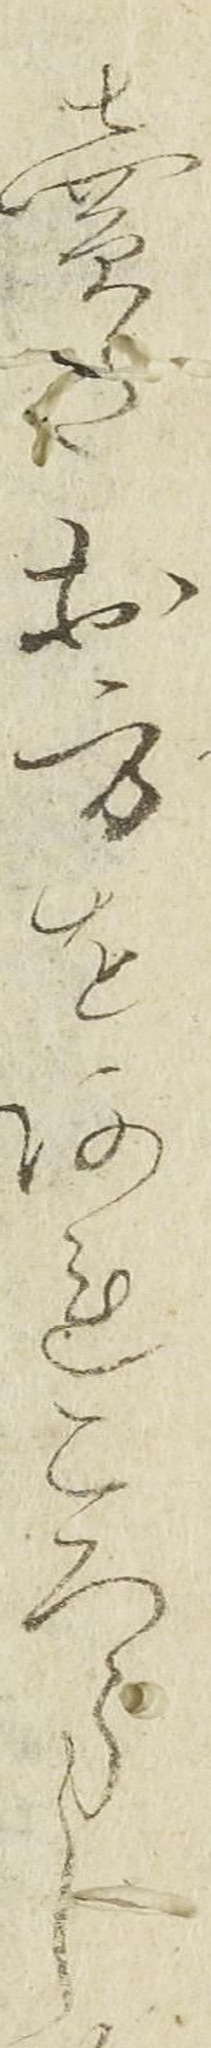売たお方をあれころましろ

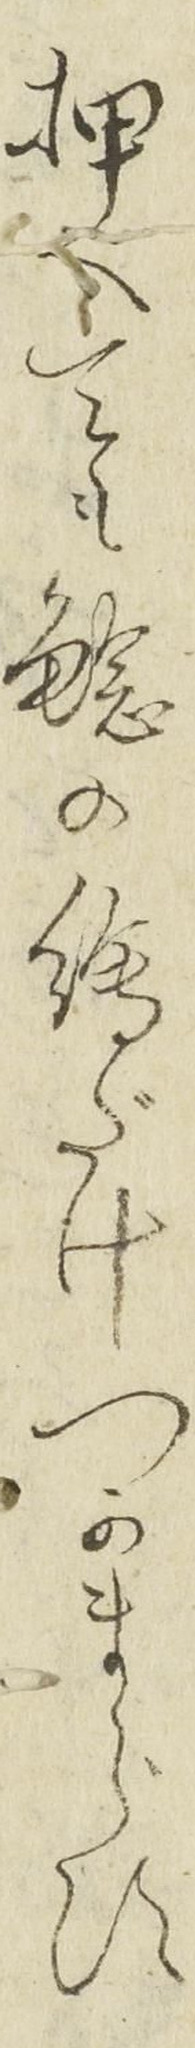押へても鯰の絵だけつかまらす
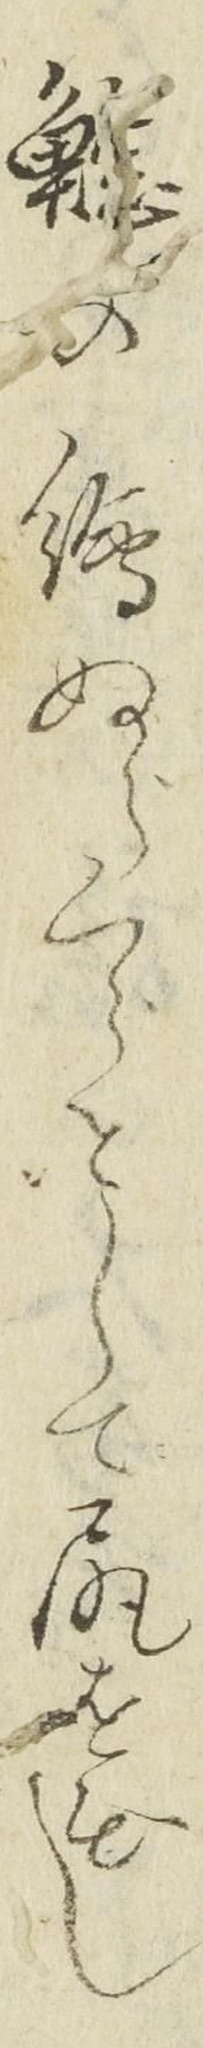鯰の絵ぬらくらとして尻を出し
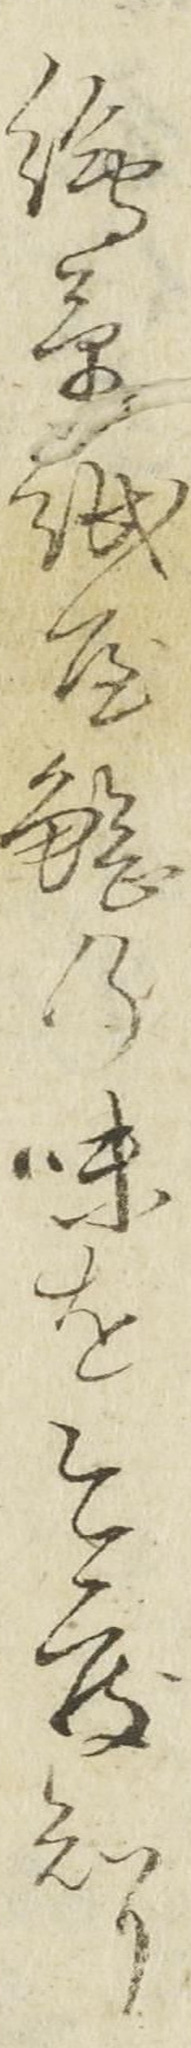絵草紙屋鯰の味を今度知り
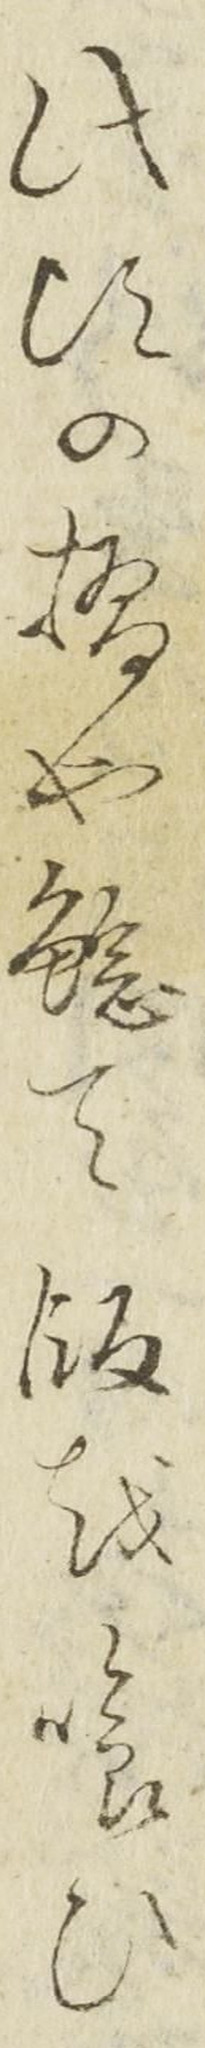此頃の摺や鯰で飯を喰ひ
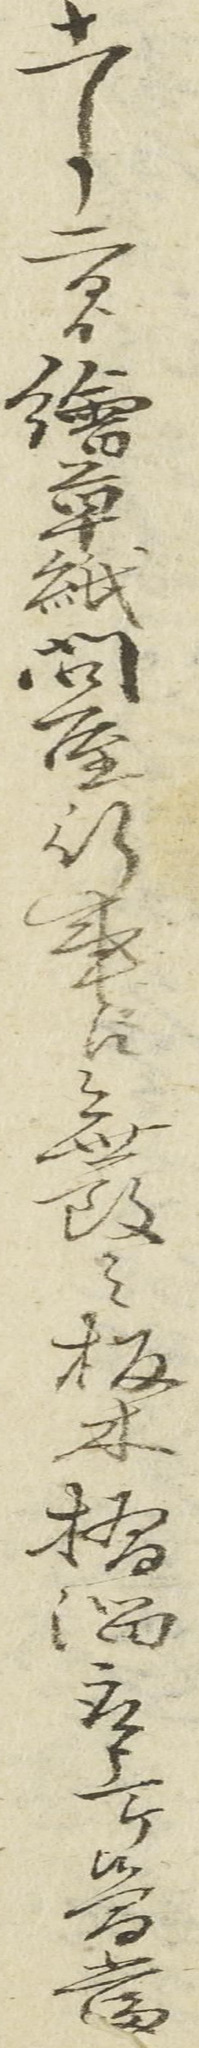十一月二日ゟ絵草紙問屋行事え無改之板木摺溜取上ケ候間当
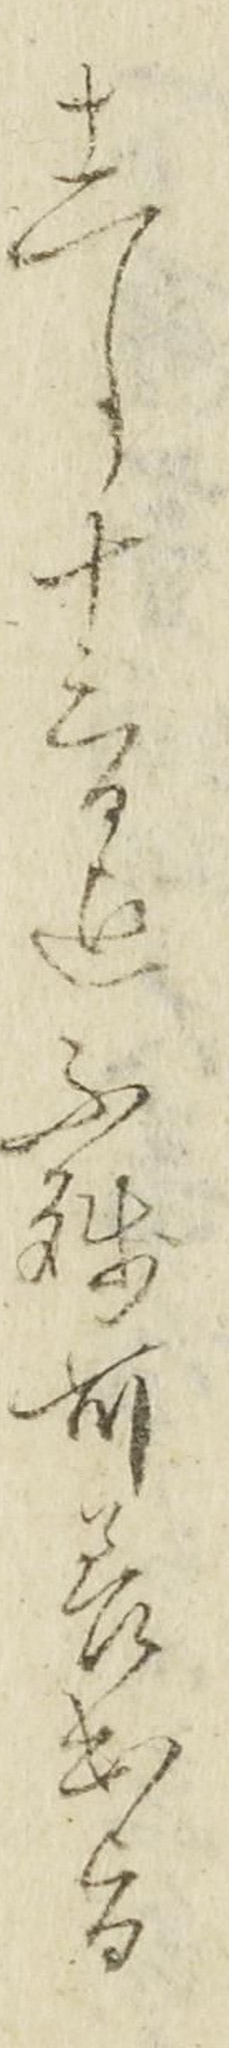十二月十三日迄不残可差出旨
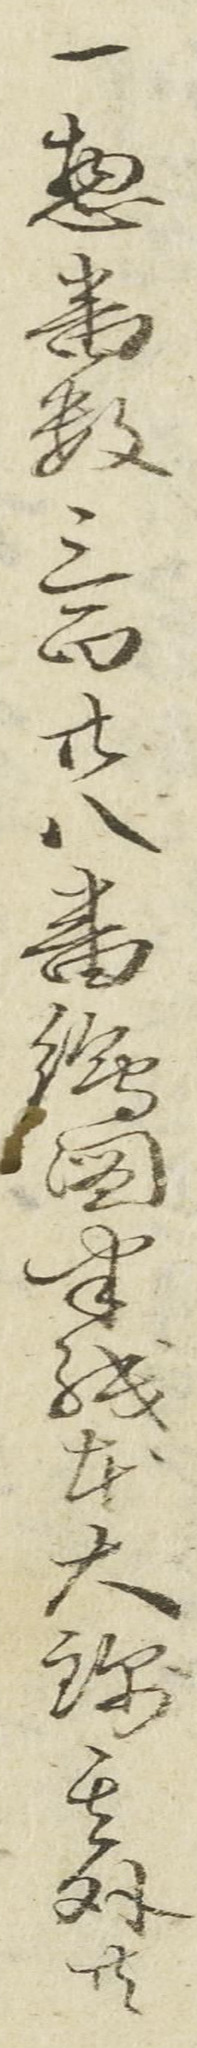一惣番数三百廿八番絵図半紙本大錦其外共
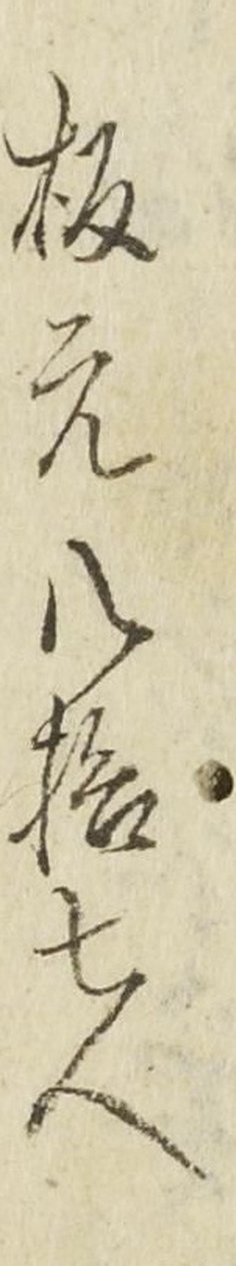板元八拾七人
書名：安政二乙卯年十月二日大地震之事
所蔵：東京大学地震研究所図書室 Earthquake Research Institute Library, The University of Tokyo, JAPAN
